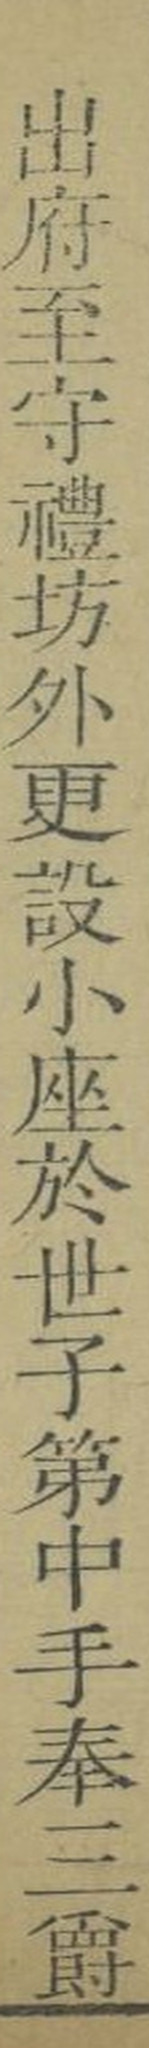出府至守禮坊外更設小座於世子第中手奉三爵
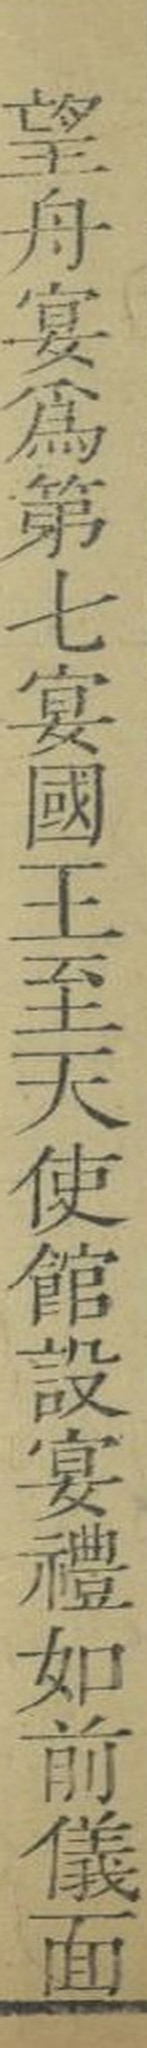望舟宴爲第七宴國王至天使館設宴禮如前儀面
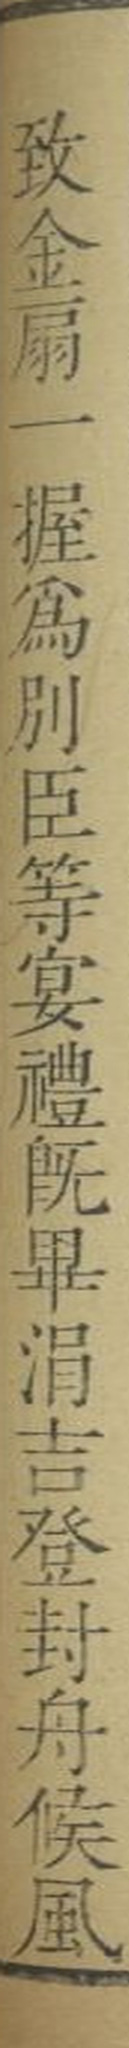致金扇一握爲別臣等宴禮既畢涓吉登封舟候風
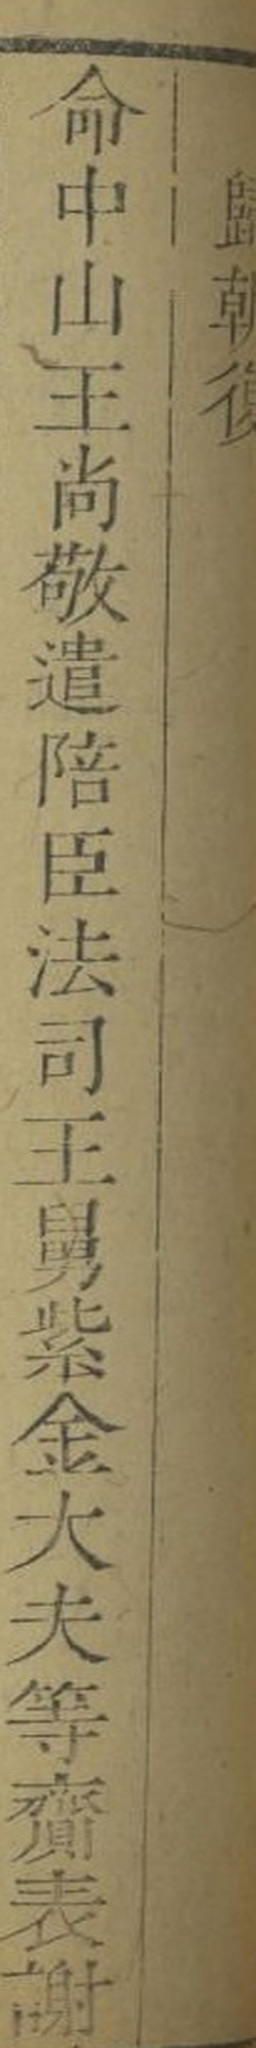命中山王尚敬遣陪臣法司王舅紫金大夫等齎表謝
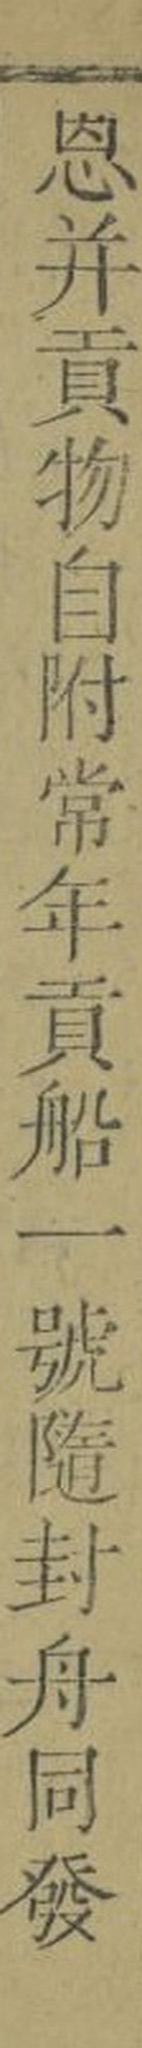恩并貢物自附常年貢船一號隨封舟同發
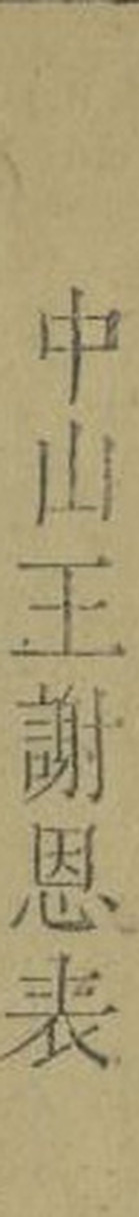中山王謝恩表
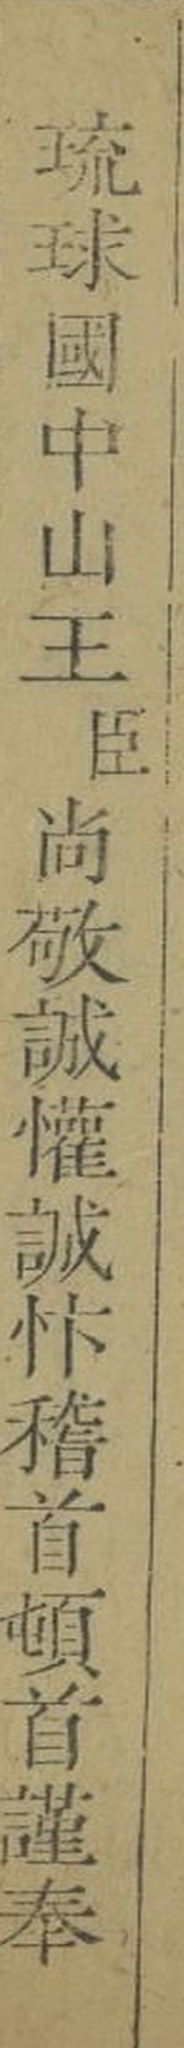琉球國中山王臣尚敬誠懽誠忭稽首頓首謹奉
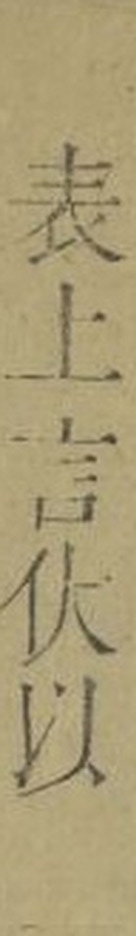表上言伏以
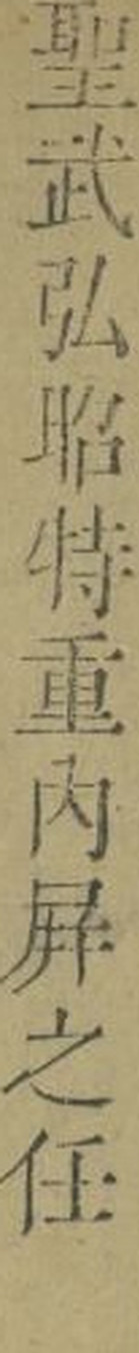聖武弘昭特重内屛之任
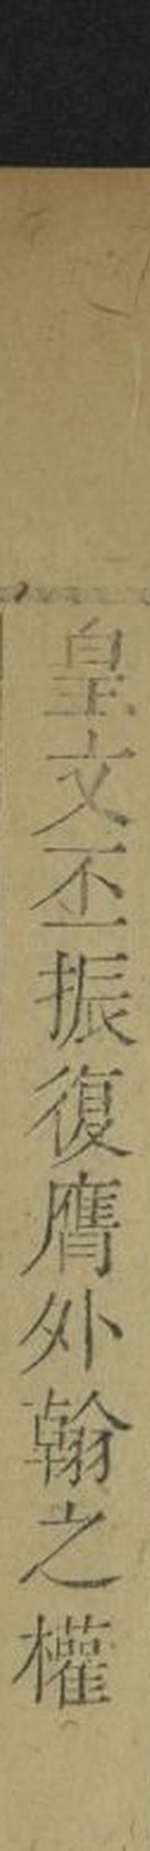皇文丕振復膺外翰之權
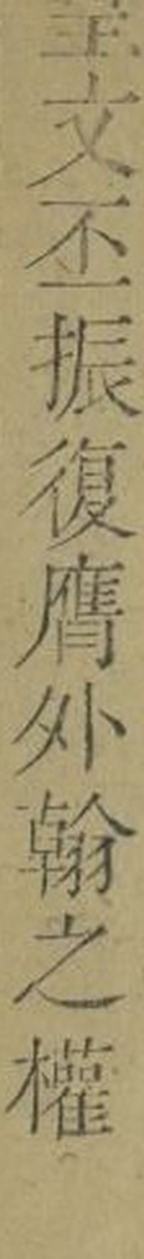皇文丕振復膺外翰之權
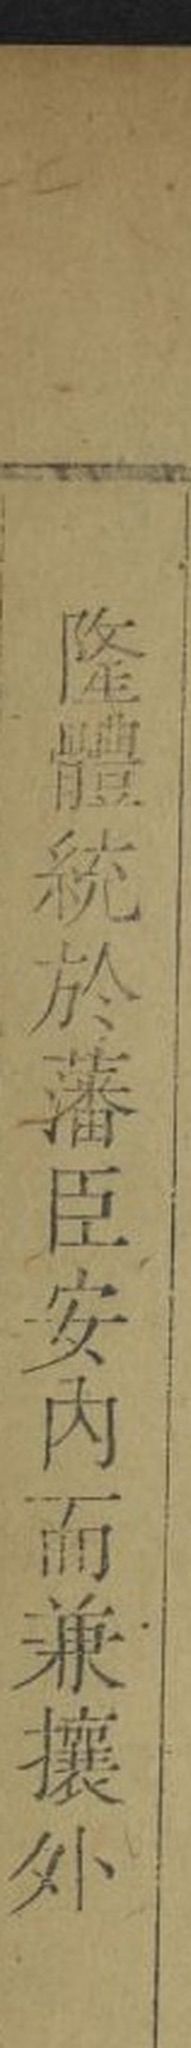隆體統於藩臣安内而兼攘外

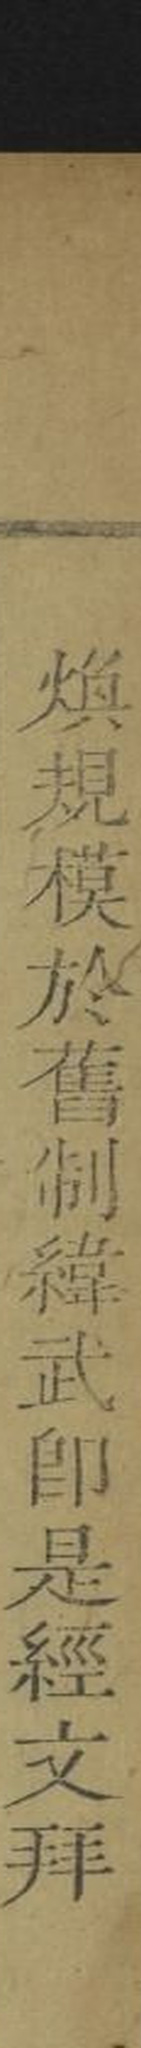煥規模於舊制緯武卽是經文拜
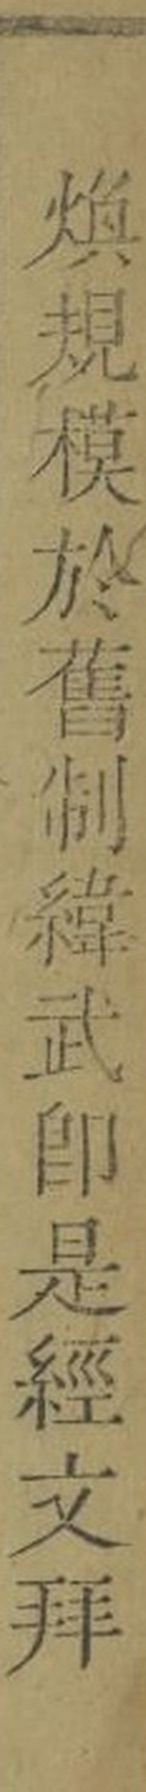煥規模於舊制緯武卽是經文拜
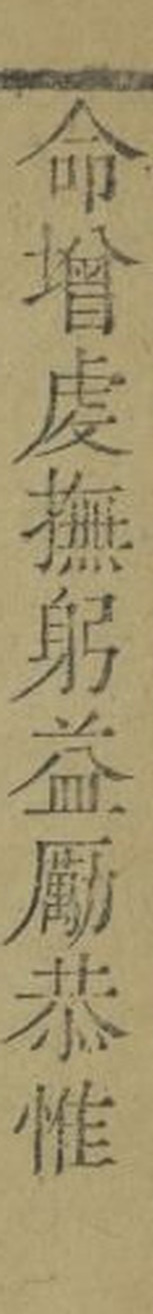命增虔撫躬益勵恭惟
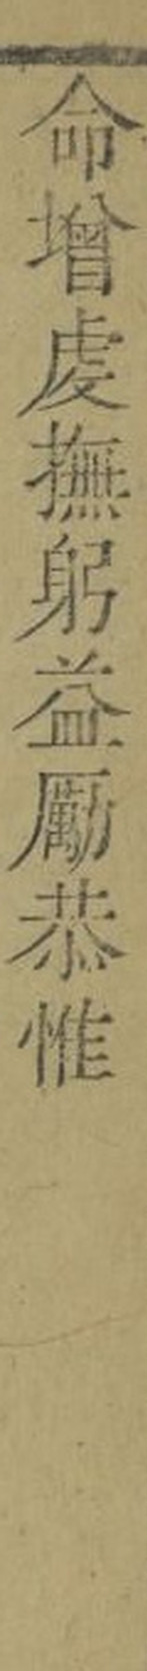命增虔撫躬益勵恭惟
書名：中山伝信録 巻二
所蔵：University of the Ryukyus Library
